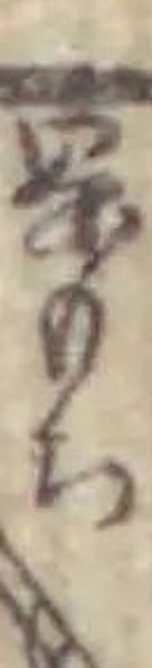岡もち
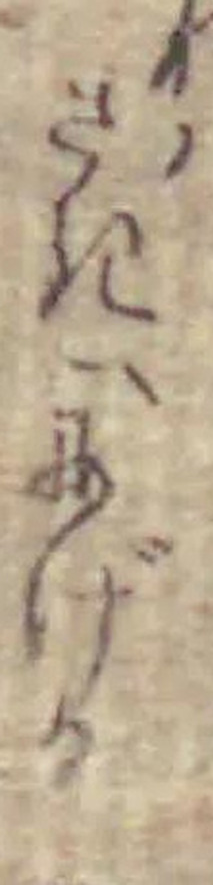さきへにげる
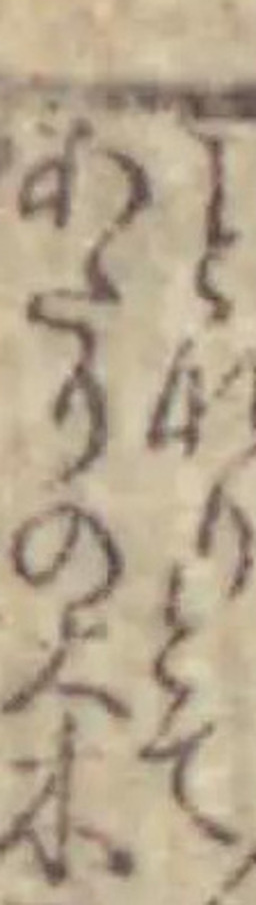あたりの大木へ
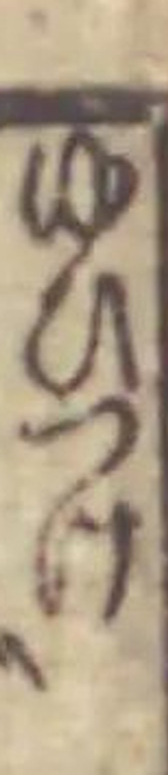ゆひつけ
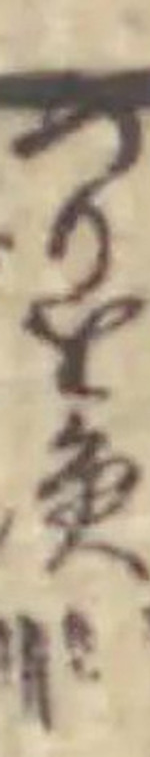つりと魚
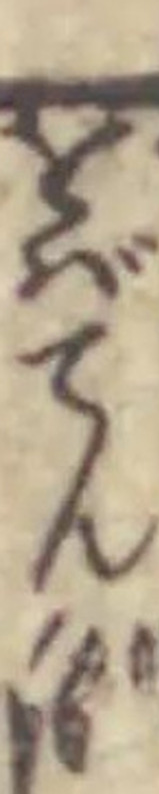をばてん
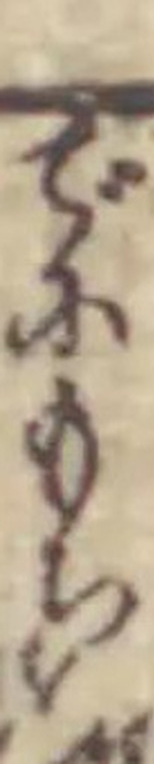でにもち
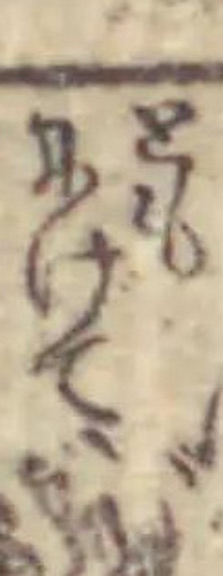にげて
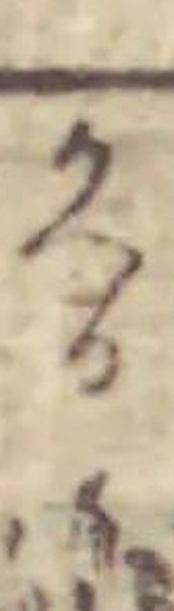かへる
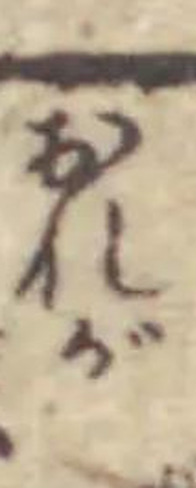おれが
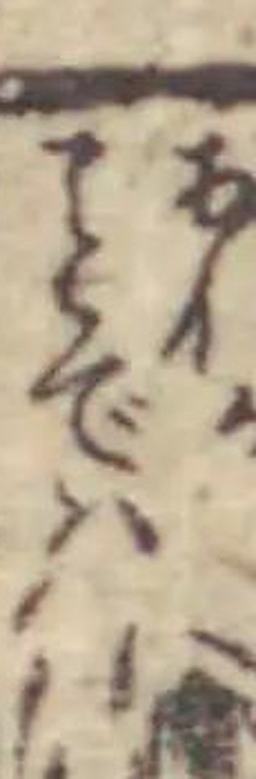ことでは
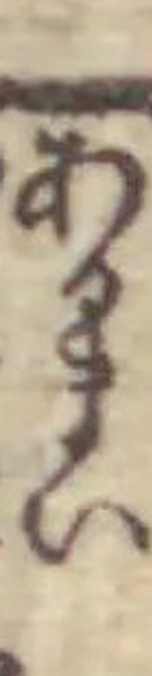あるまい
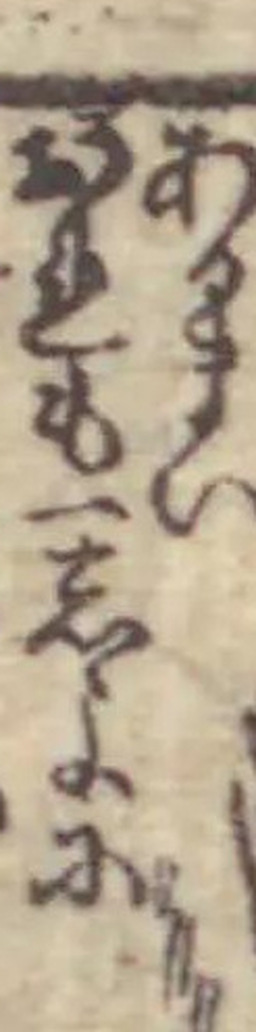おれも一しよに
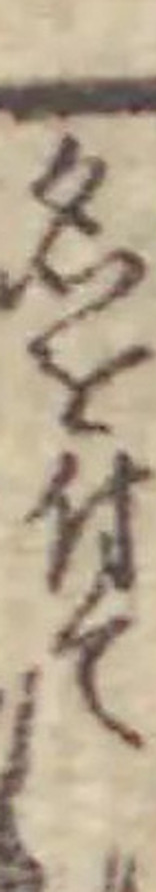名を付て
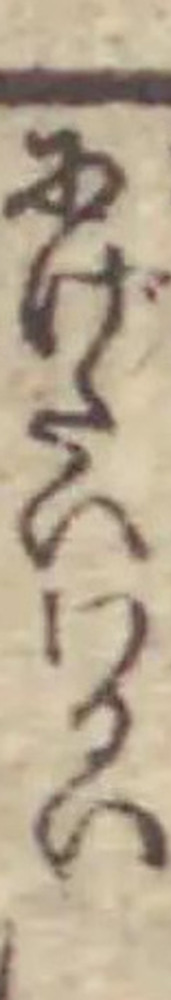にげたいワるい
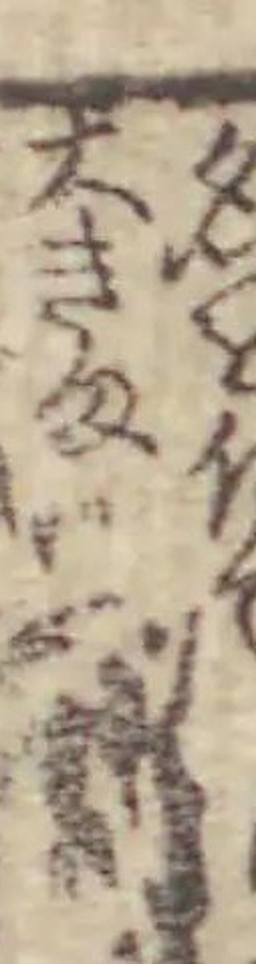大きま
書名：亀山人家妖 3巻
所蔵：国立国会図書館 National Diet Library, JAPAN
